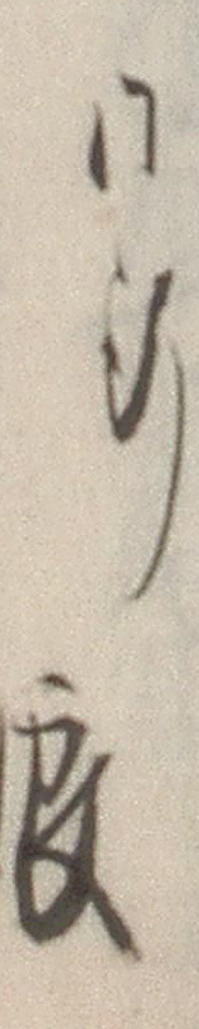同断娘
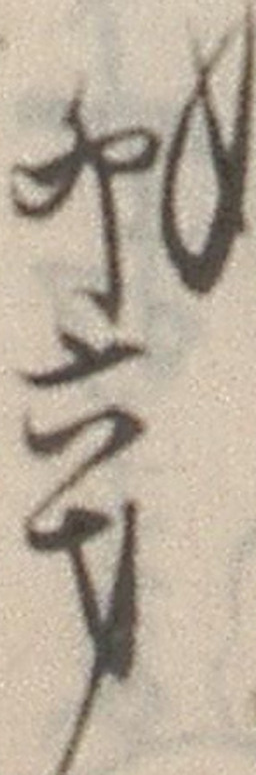卯六才
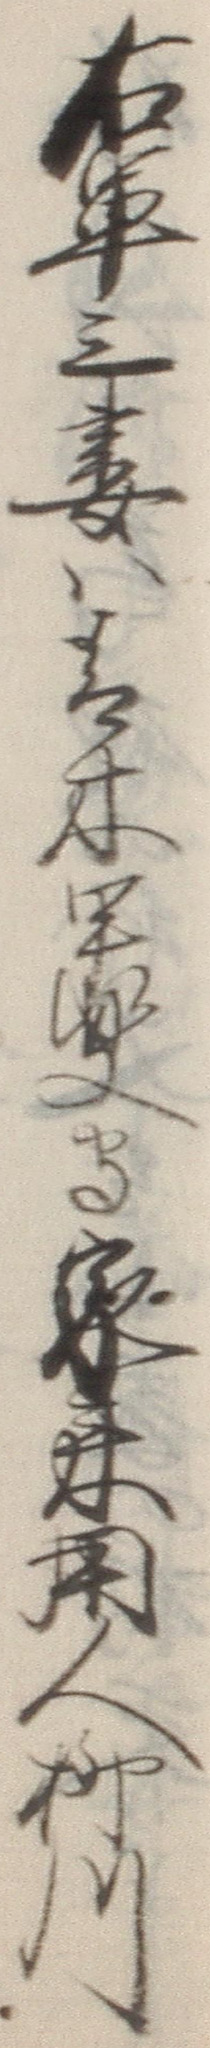右軍三妻ハ青木甲斐守家来用人柳川
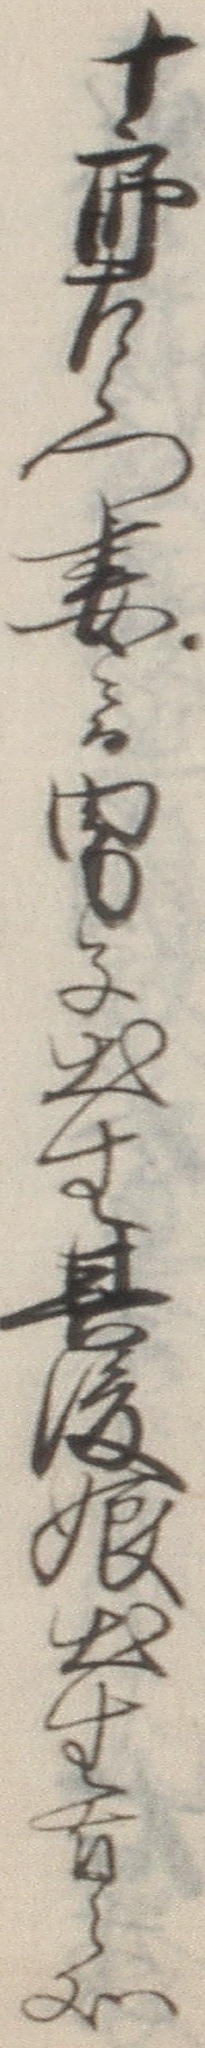十郎左衛門妻ニ而男子出生其後娘出生有之処
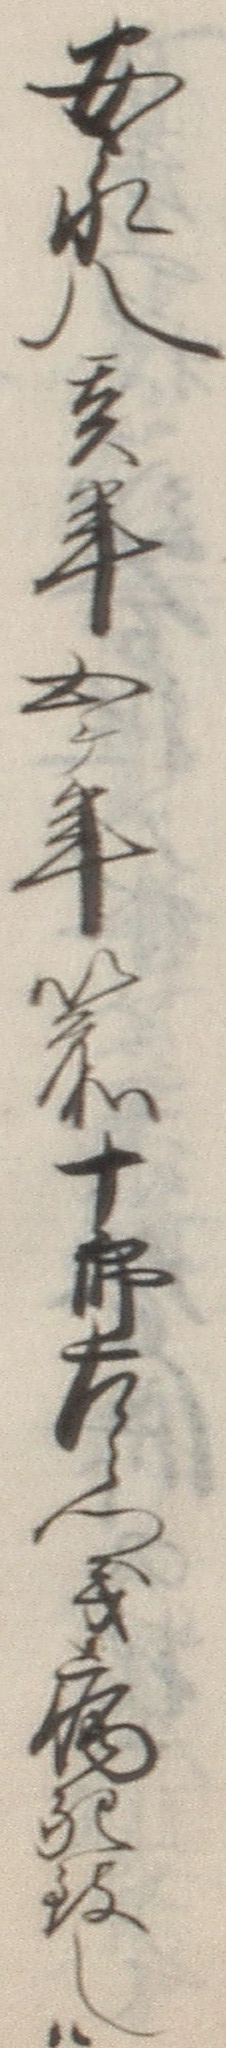安永八亥年五ケ年以前十郎左衛門義病死致し
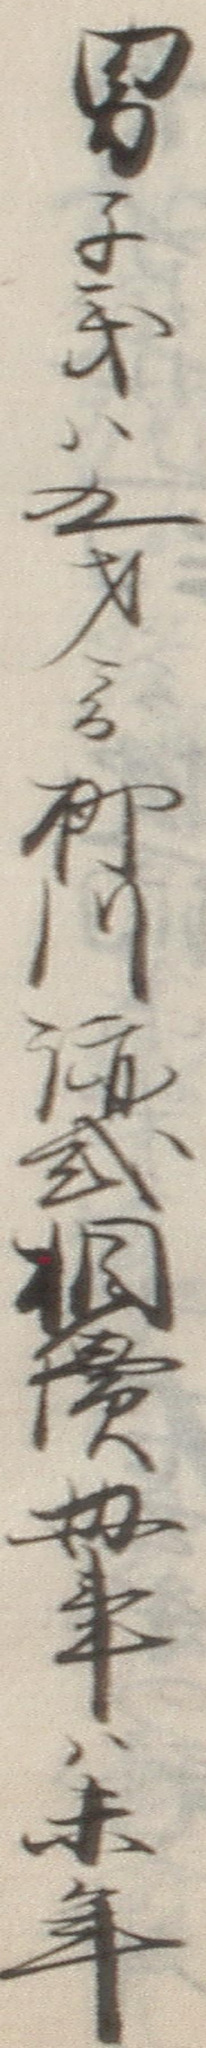男子義ハ九才ニ而柳川跡式相続此事ハ未年
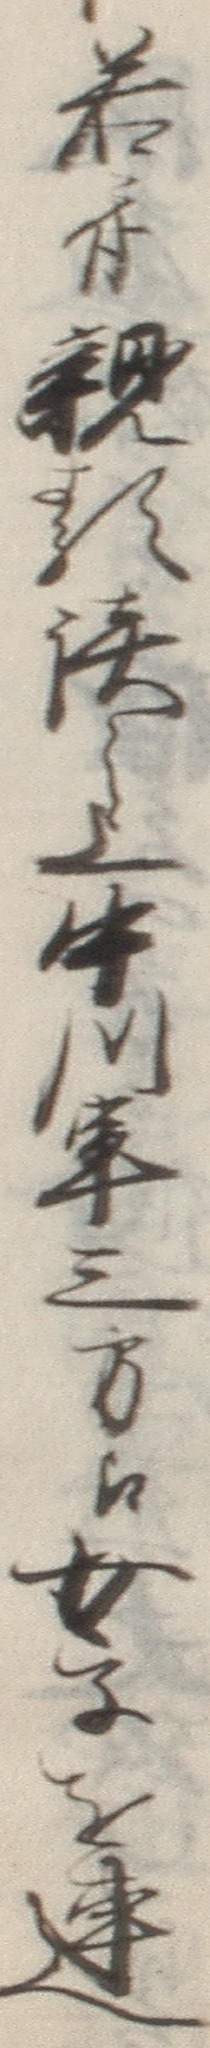若ニ付親類談之上中川軍三方え女子を連
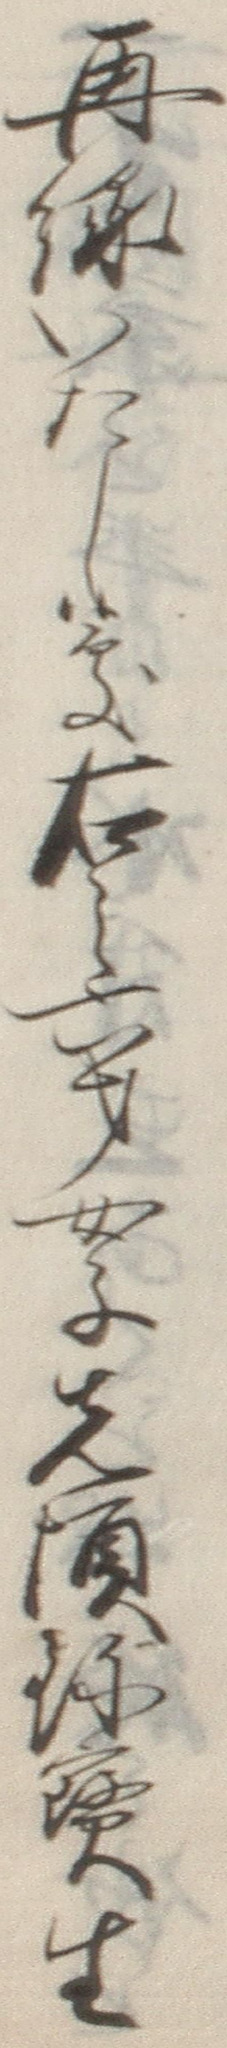再縁いたし候処右之六才女子先頃珍宝生
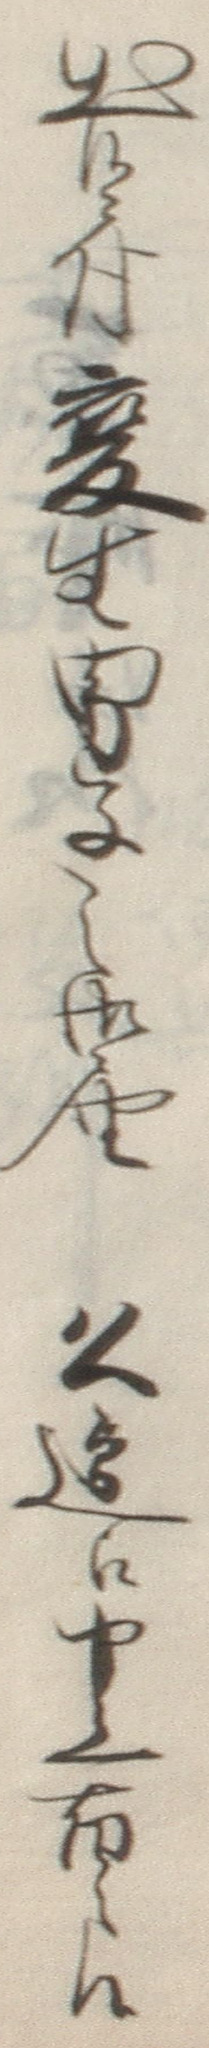出候ニ付変生男子之御届公辺え申上有之候
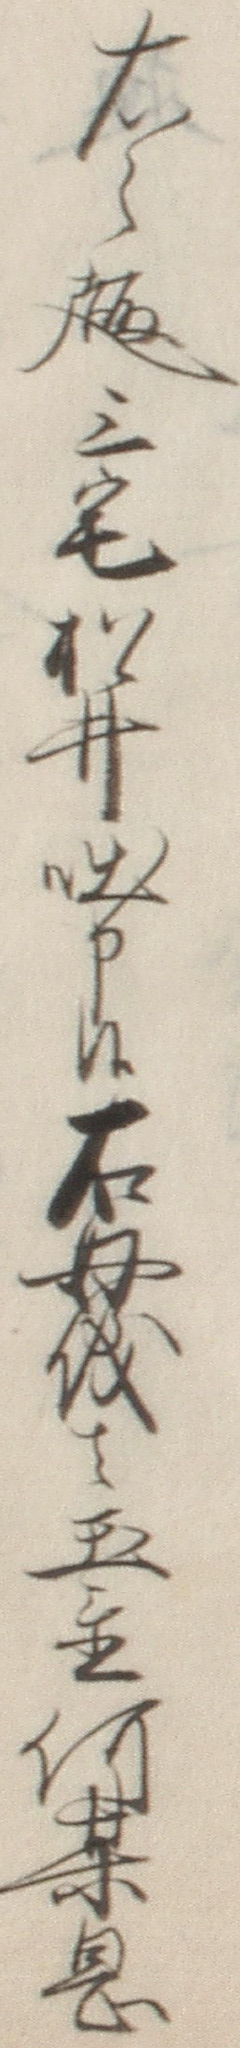右之趣三宅松井咄申候右母儀は玉置何某息

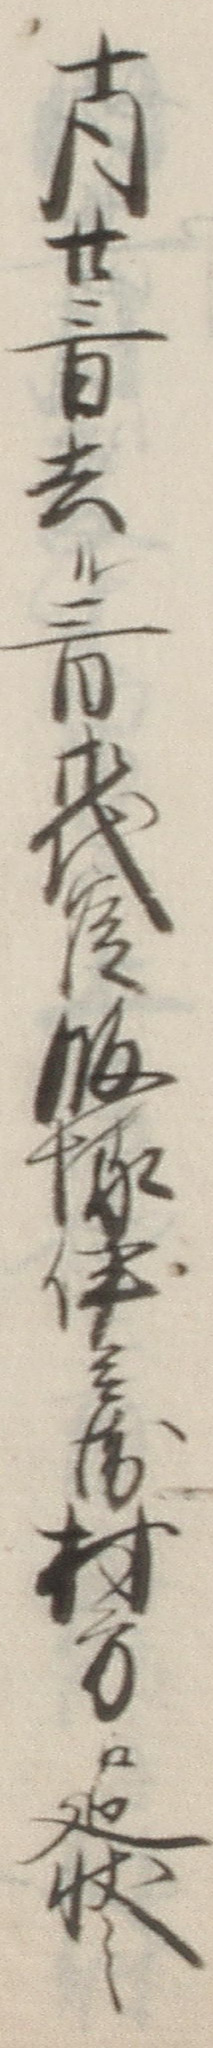拾月廿三日去ル三日御代官飯塚伊兵衛村方え廻状之
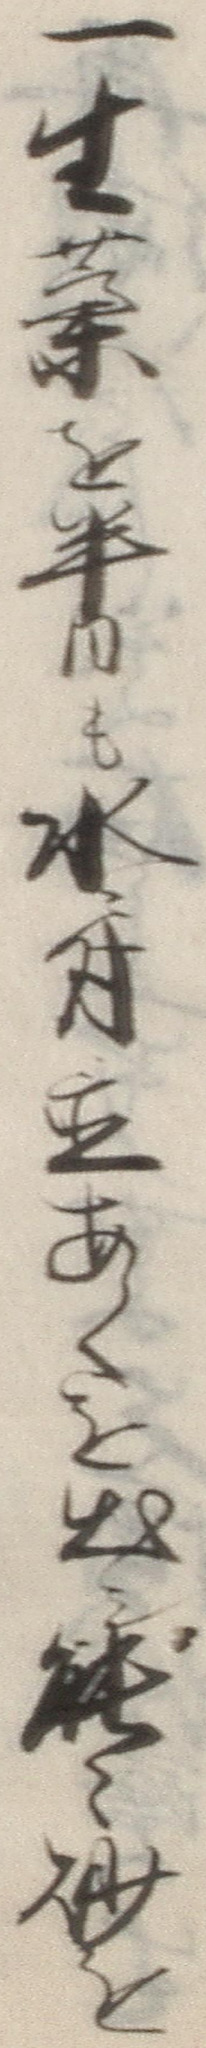一生藁を半日も水ニ付置あくを出シ能々砂を
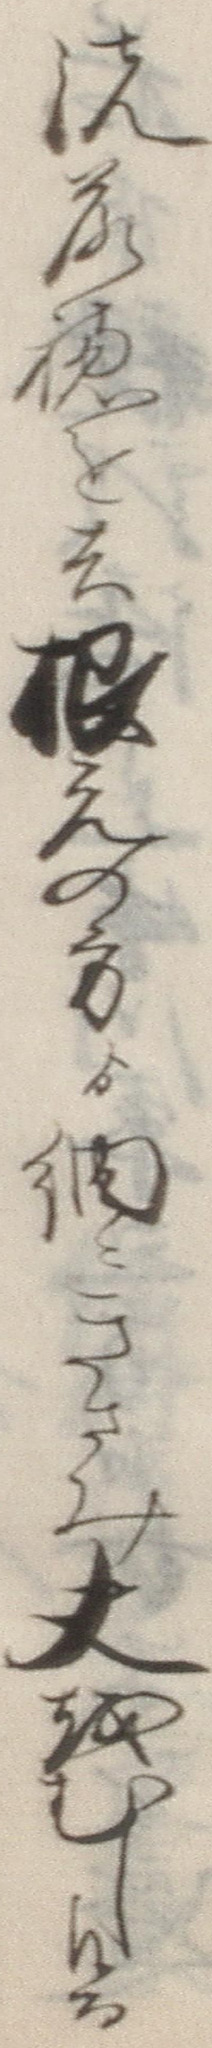洗落穂を去根元の方ゟ細ニきさみ夫をむし候而
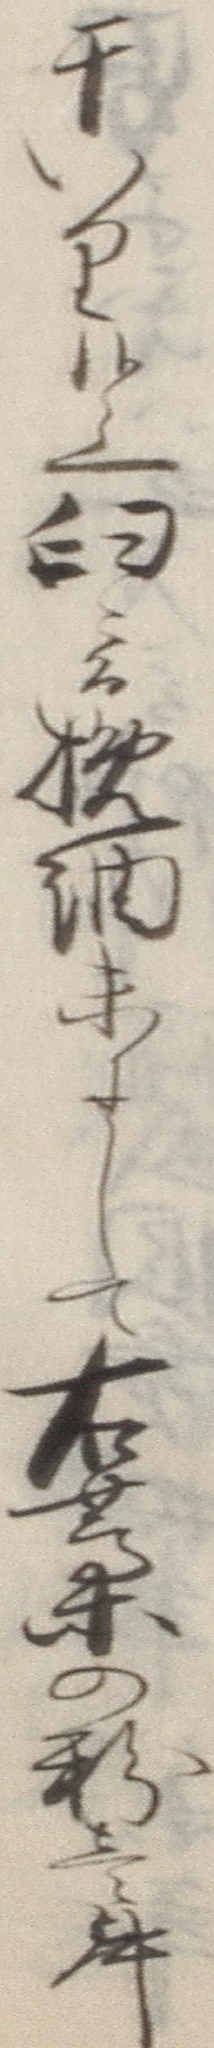干いり候上臼ニ而挽細末にして右藁の粉壱升
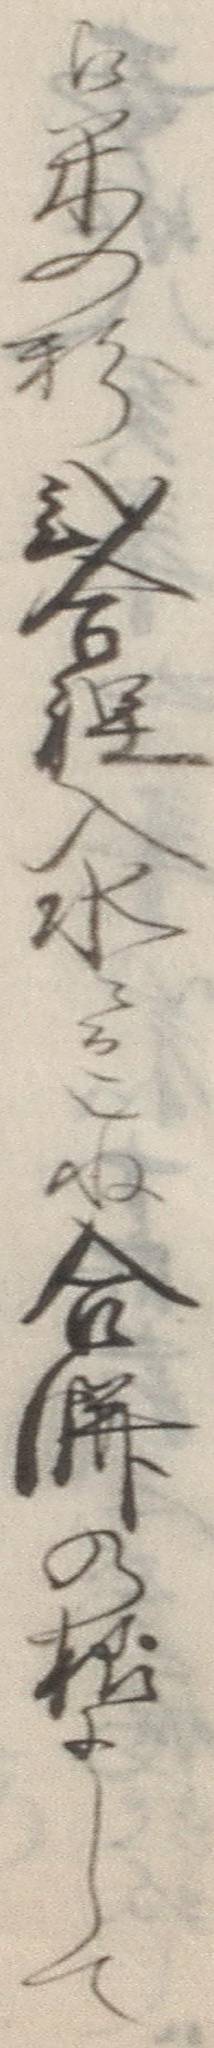え米の粉弐合程入水ニ而こね合済の様にして
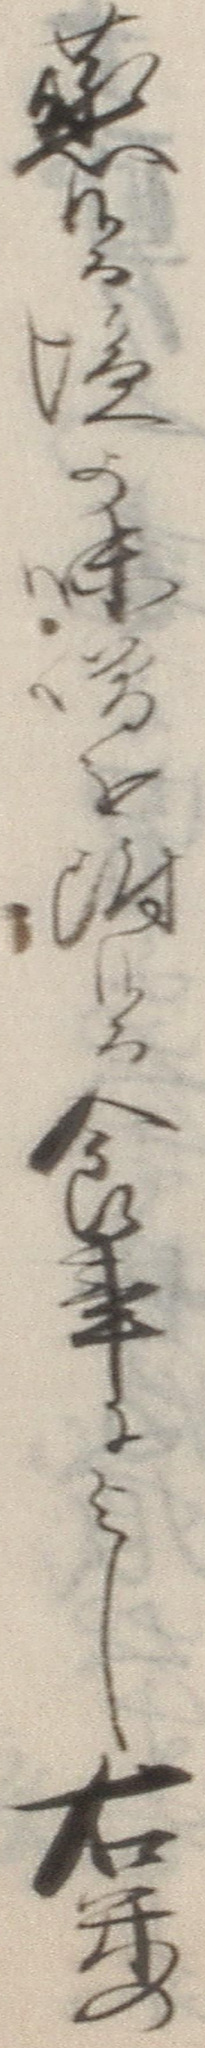蒸候而塩か味噌を附候而食事によし右米の
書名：[諸国災害記録]
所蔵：東京大学地震研究所図書室 Earthquake Research Institute Library, The University of Tokyo, JAPAN
